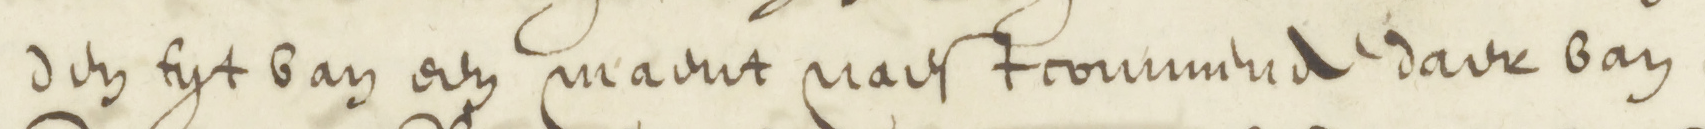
den tyt van een maent naestcommende daer van
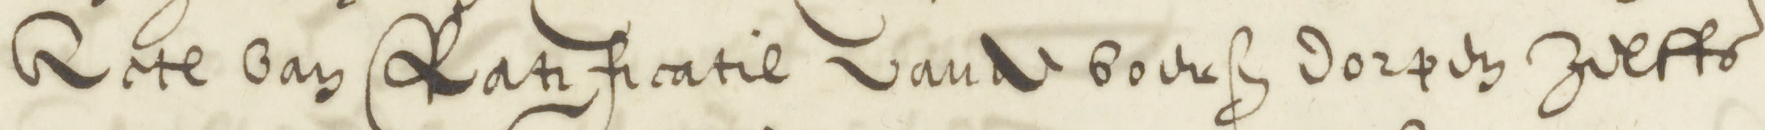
Acte van Ratificatie vande voers dorpen zelffs
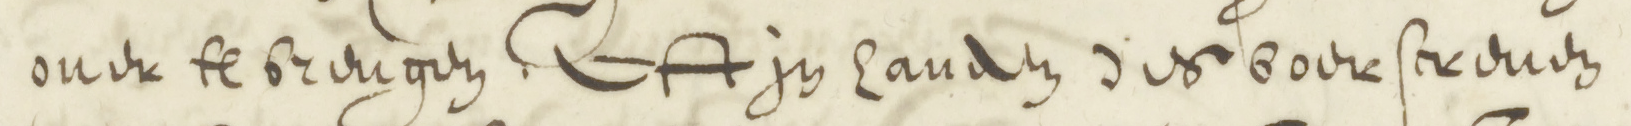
ouer te brengen Off in handen des voerscreuen
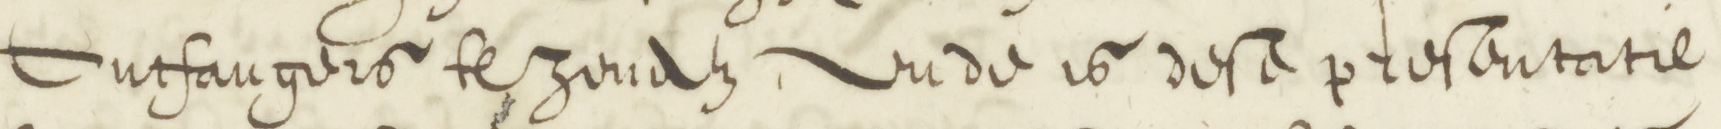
Ontfangers te zenden, ende is dese presentatie
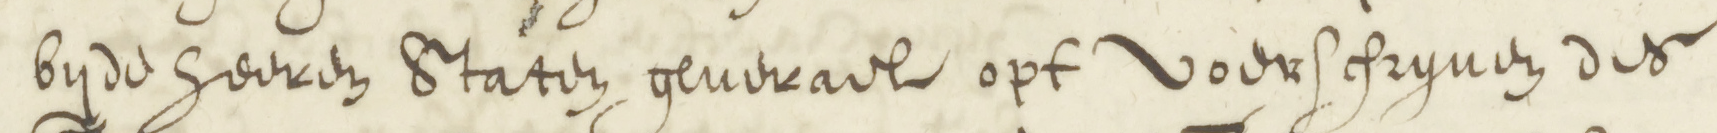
byde heeren Staten generael opt voerschryuen des
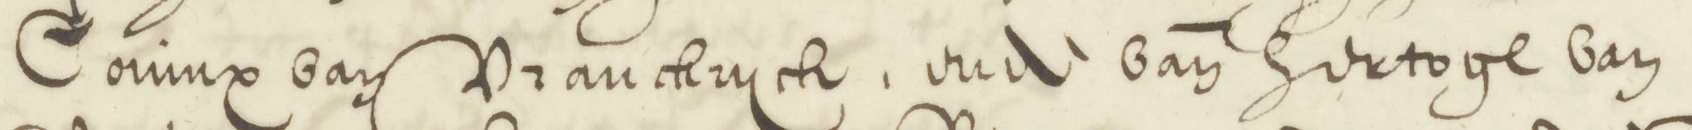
Conincx van Vranckryck, ende van hertoge van
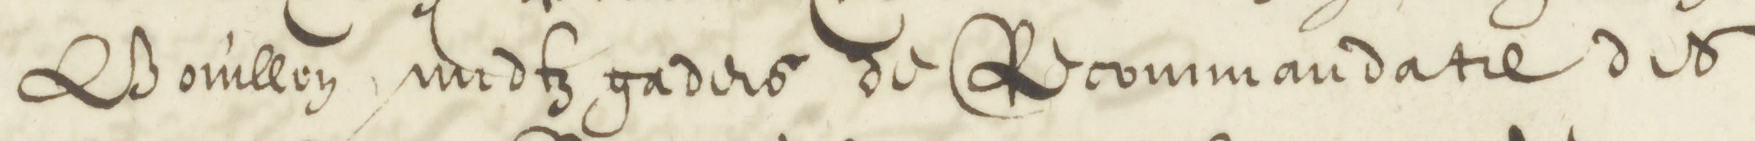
Bouillon, midtz gaders de Recommandatie des
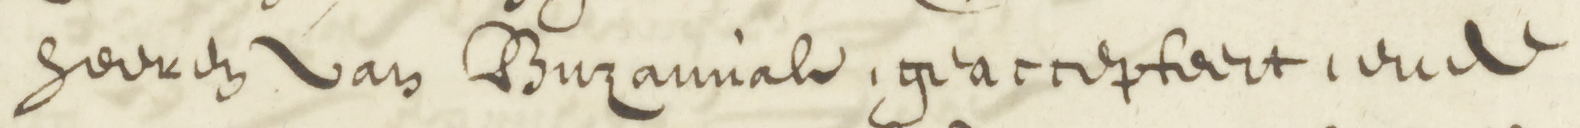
heeren van Buzanual, geaccepteert, ende
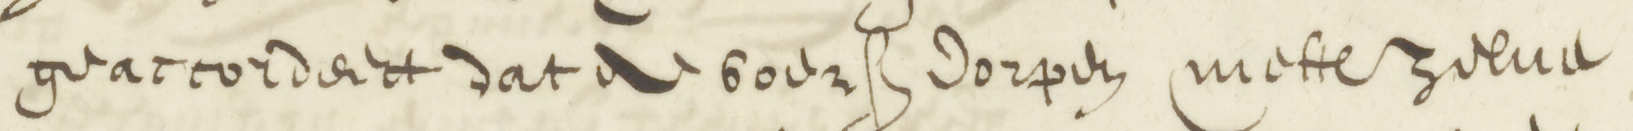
geaccordeert dat de voers dorpen mette zelve
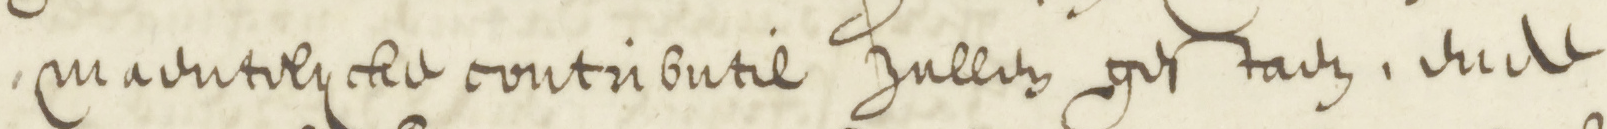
maentelycke contributie zullen gestaen, ende
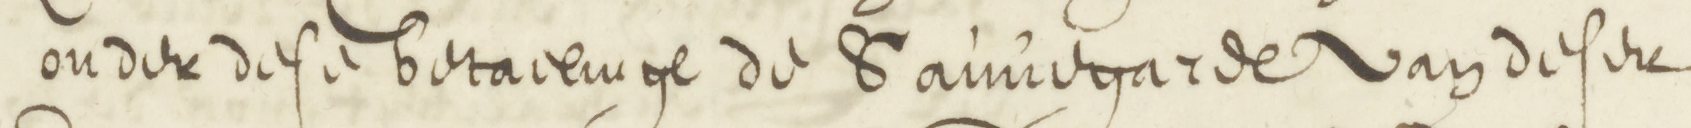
onder dese betaelinge de Sauuegarde van deser
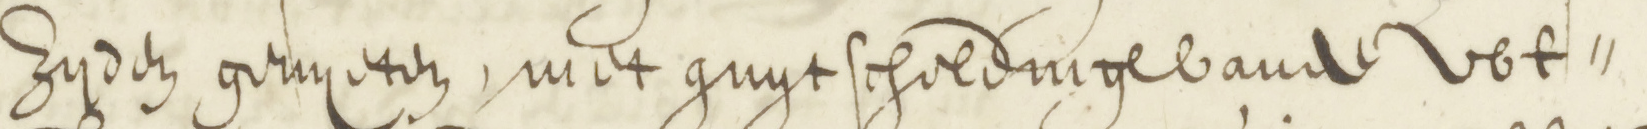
Zyden genyeten, met quytscheldinge vande wt„
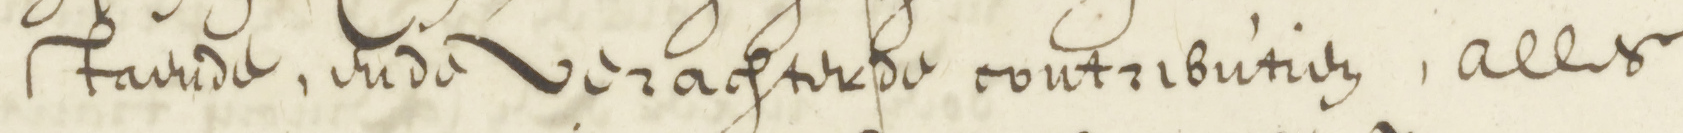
staende, ende verachterde contributien, alles
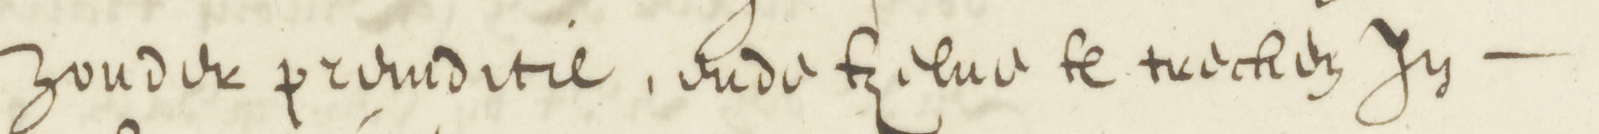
zonder preiuditie, ende tzelve te trecken In —
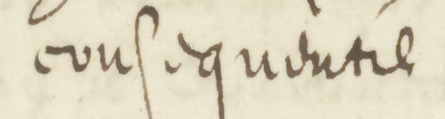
consequentie.
